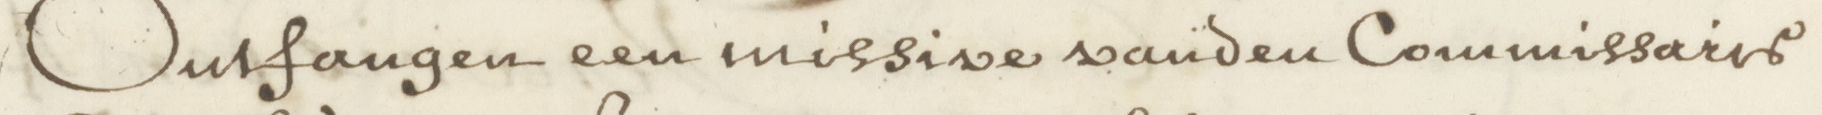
Ontfangen een missive vanden Commissaris
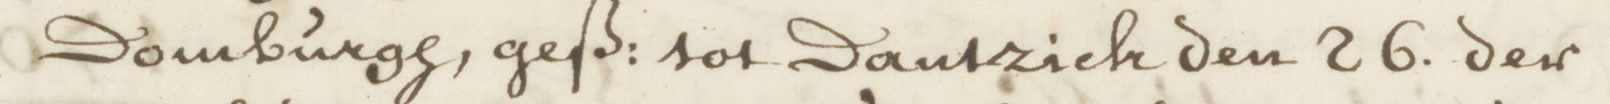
Domburgh, ges: tot Dantzick den 26. der
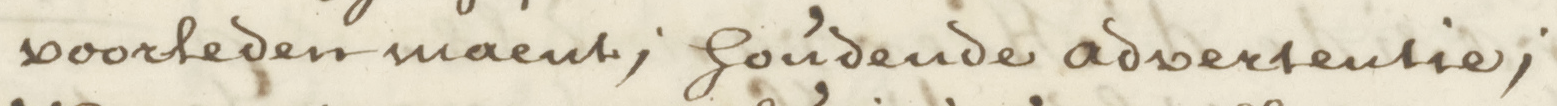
voorleden maent; houdende advertentie;
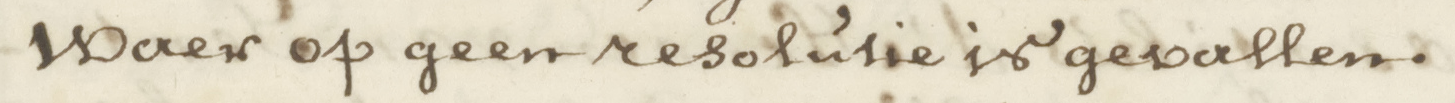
Waer op geen resolutie is gevallen
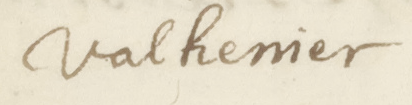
Valkenier
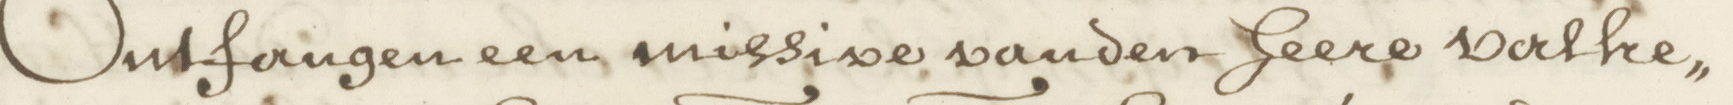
Ontfangen een missive vanden heere Valke„
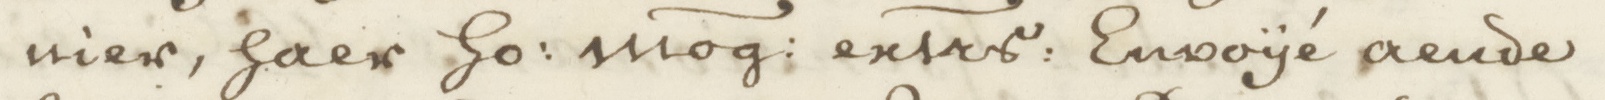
nier, haer Ho:Mog: extrs: Envoijé aende
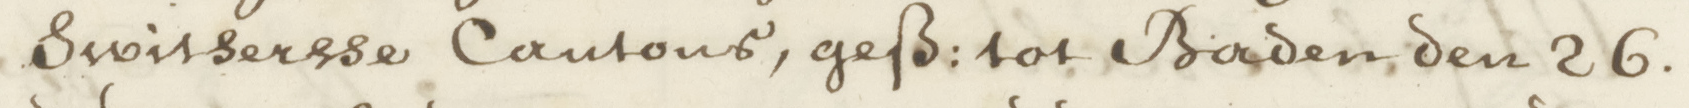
Switsersse Cantons, ges: tot Baden den 26.
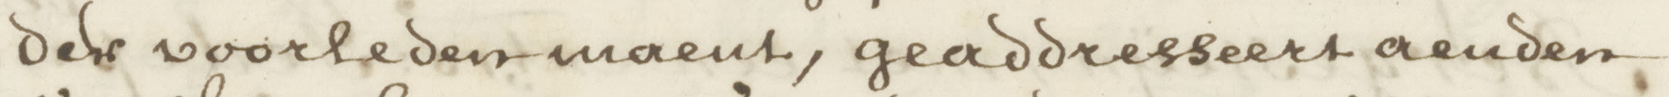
der voorleden maent, geaddresseert aenden
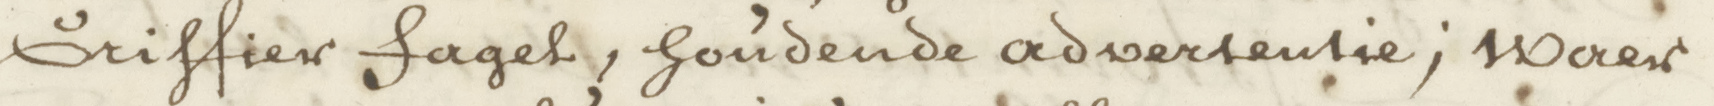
Griffier Fagel, houdende advertentie; Waer
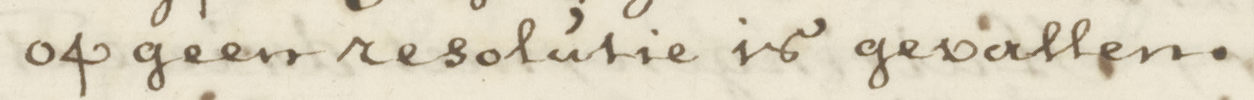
op geen resolutie is gevallen.
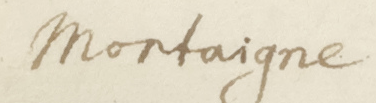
Mortaigne
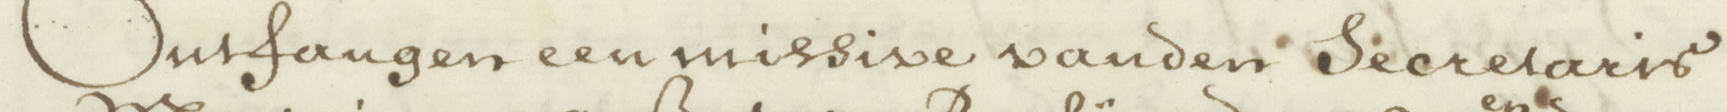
Ontfangen een missive vanden secretaris
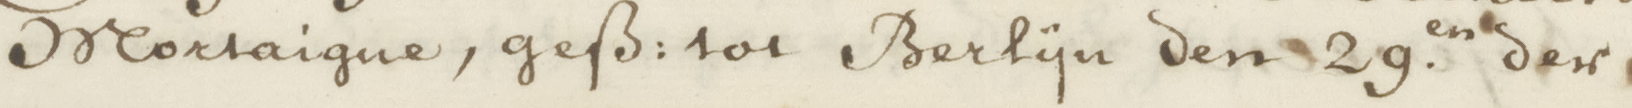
Mortaigne, ges: tot Berlijn den 29en. der
